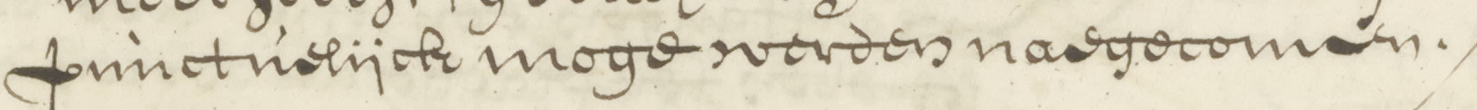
punctuelijck moge werden naegecomen.
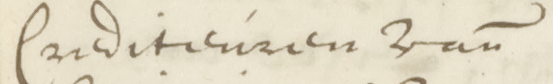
Crediteuren van
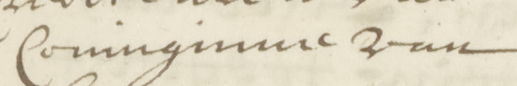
Coninginne van
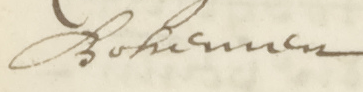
Bohemen
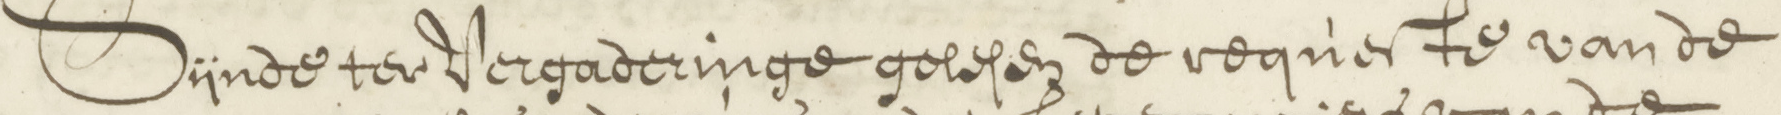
Sijnde ter Vergaderinge gelesen de requeste van de
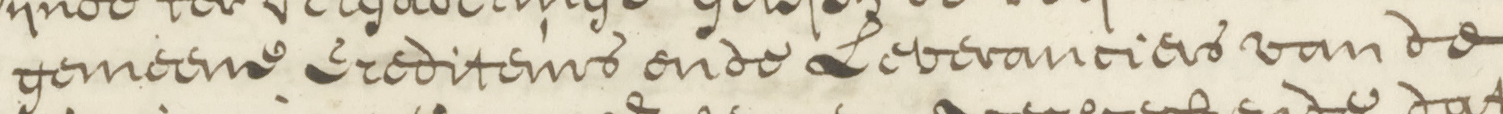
gemeene Crediteurs ende Leveranciers van de
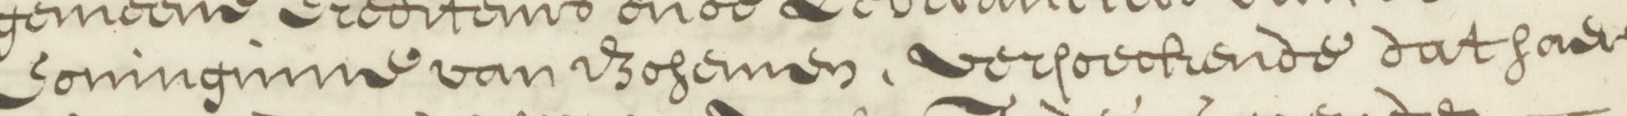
Coninginne van Bohemen, versoeckende dat haer
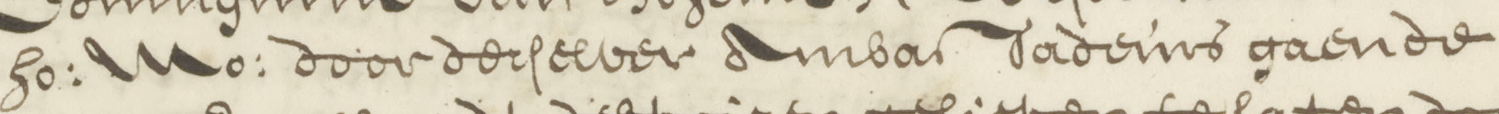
ho:Mo: door derselver Ambassadeurs gaende
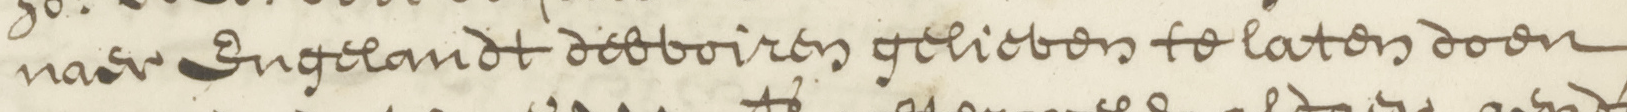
naer Engelandt debvoiren gelieven te laten doen
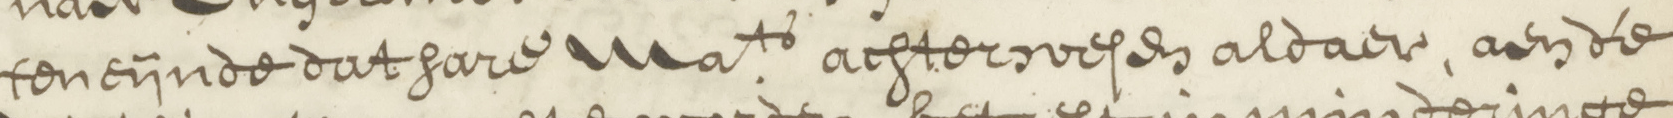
ten eijnde dat hare Mats. achterwesen aldaer, aen de
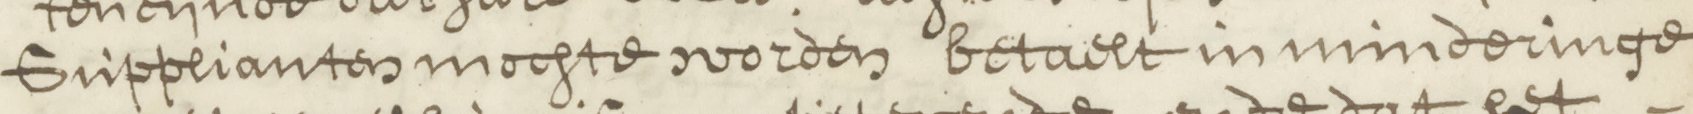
Supplianten mochte worden betaelt in minderinge
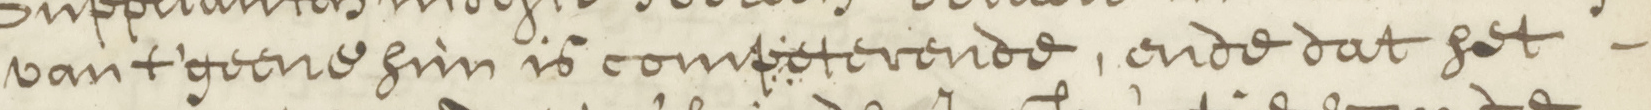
van t'geene hun is competerende, ende dat het -
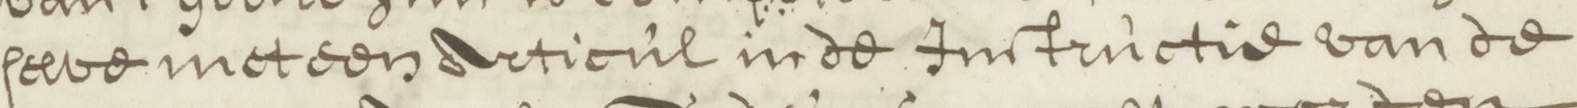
selve met een Articul inde Instructie van de
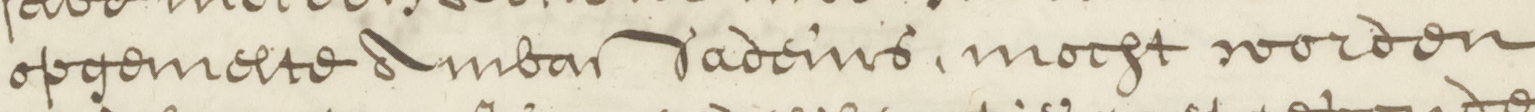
opgemelte Ambassadeurs, mocht worden
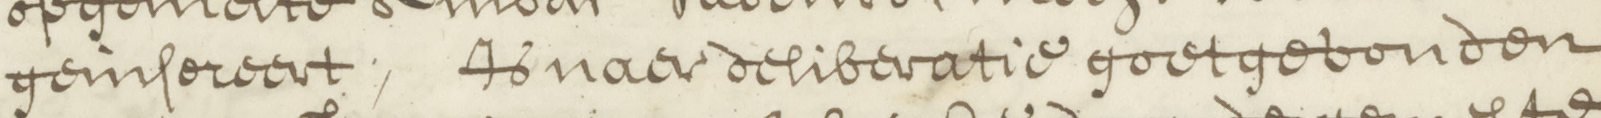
geinsereert; Is naer deliberatie goetgevonden
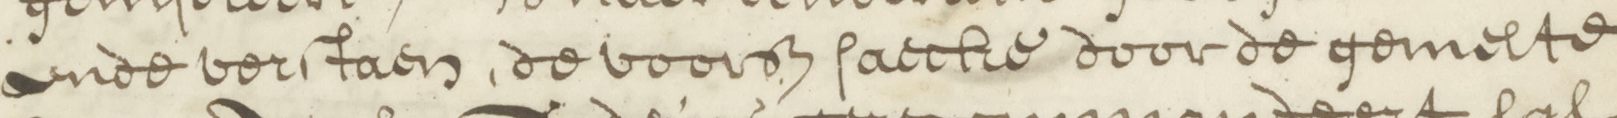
ende verstaen, de voors saecke door de gemelte
